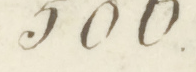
506.
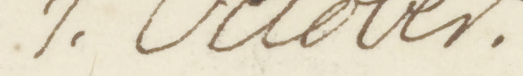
7. October.
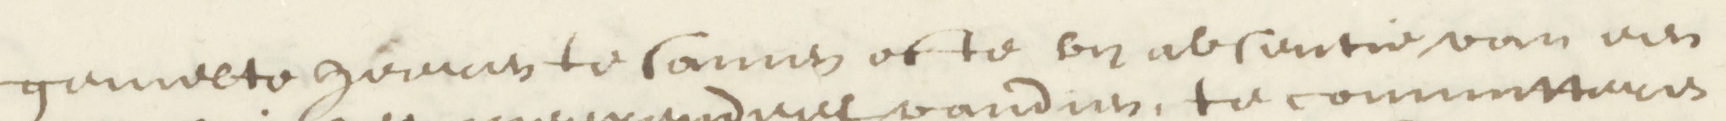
gemelte heeren te samen ofte by absentie van een
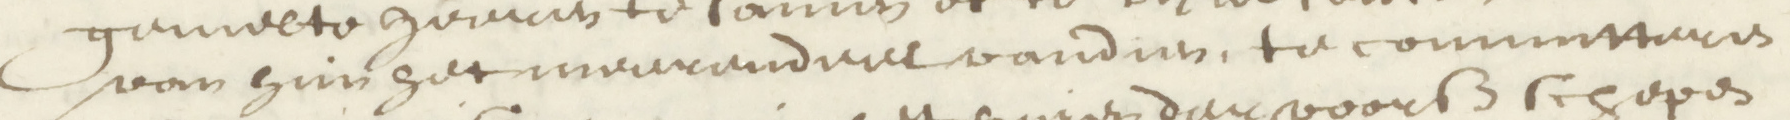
van hun het meerendeel vandien, te committeren
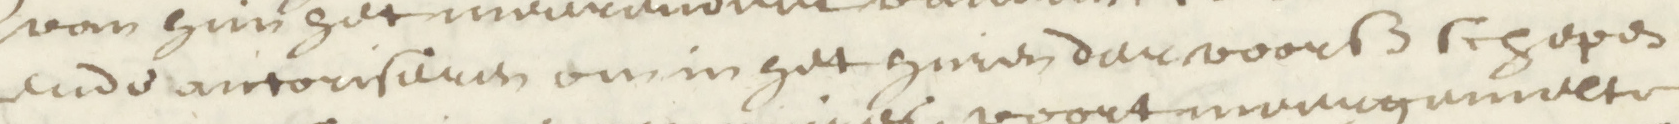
ende autoriseren om in het huren der voors schepen
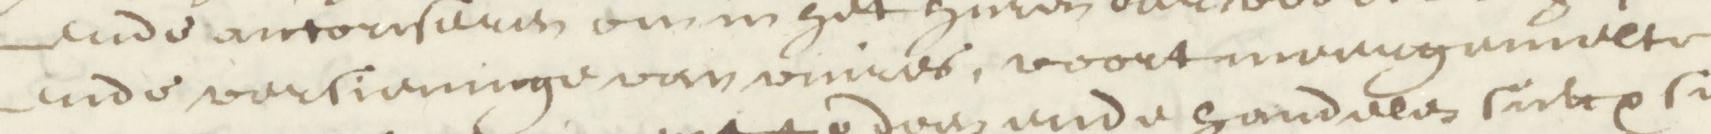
ende versieninge van viures, voort meergemelte
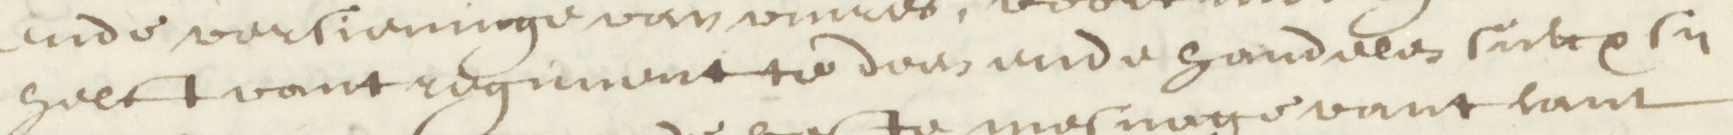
helft vant regiment te doen ende handelen sulcx sy
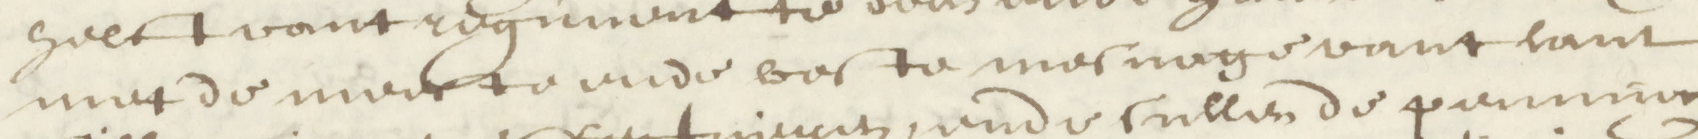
met de meeste ende beste mesnage vant lant
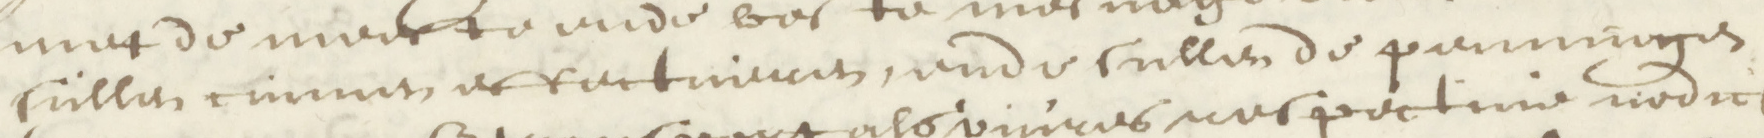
sullen cunnen effectueren, ende sullen de penningen
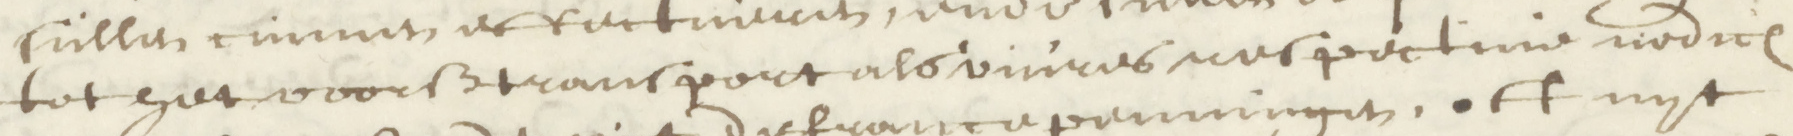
tot het voors transport als viures respectiue nodich
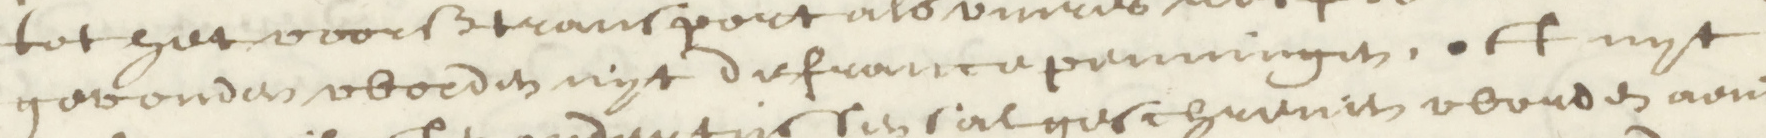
gevonden worden uyt de france penningen, off uyt
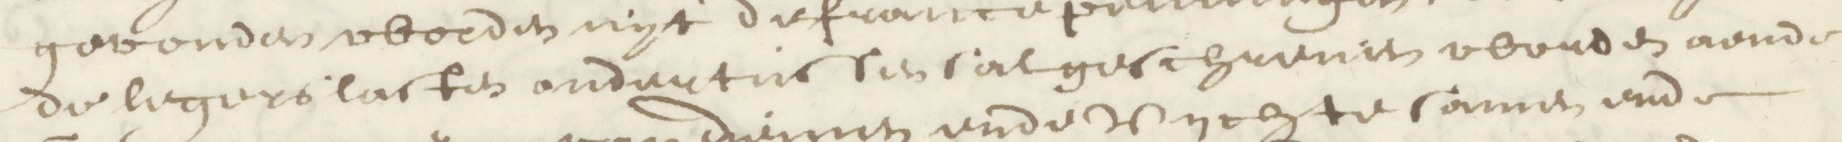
de legerslasten ondertussen sal geschreuen worden aende
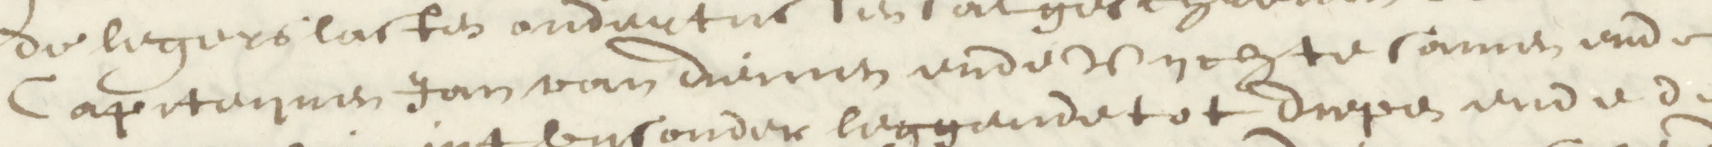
Capiteynen Jan van diemen ende Vych te samen ende
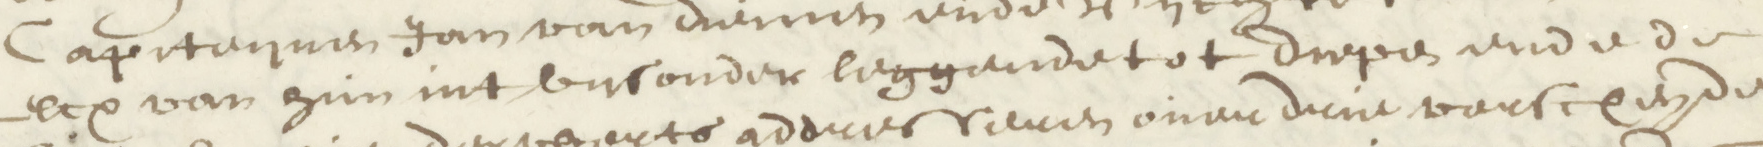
elcx van hun int bysonder leggende tot diepen ende de
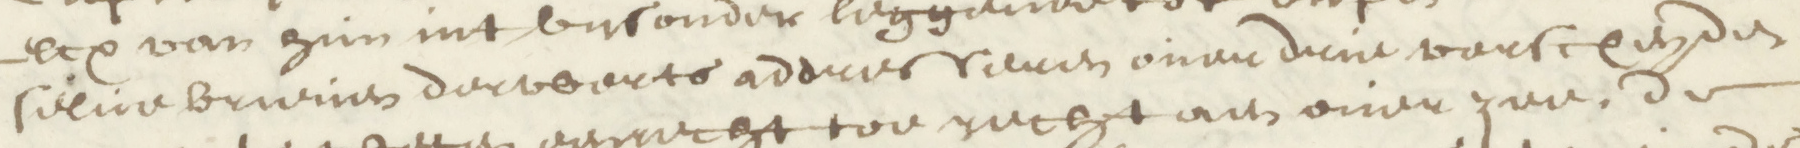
selue brieuen derwerts addresseren ouer drie verscheyden
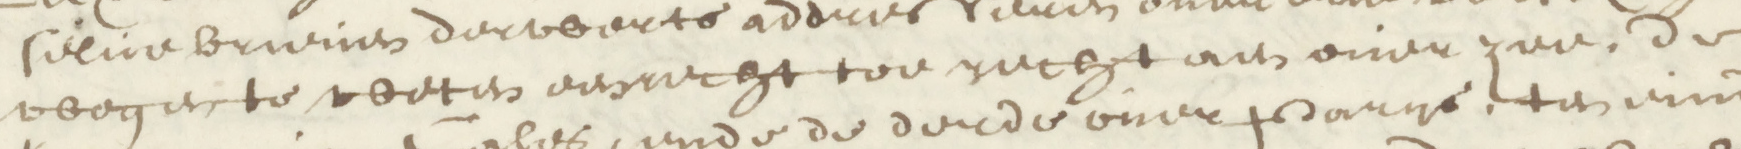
wegen te weten een recht toe recht aen ouer zee, de
